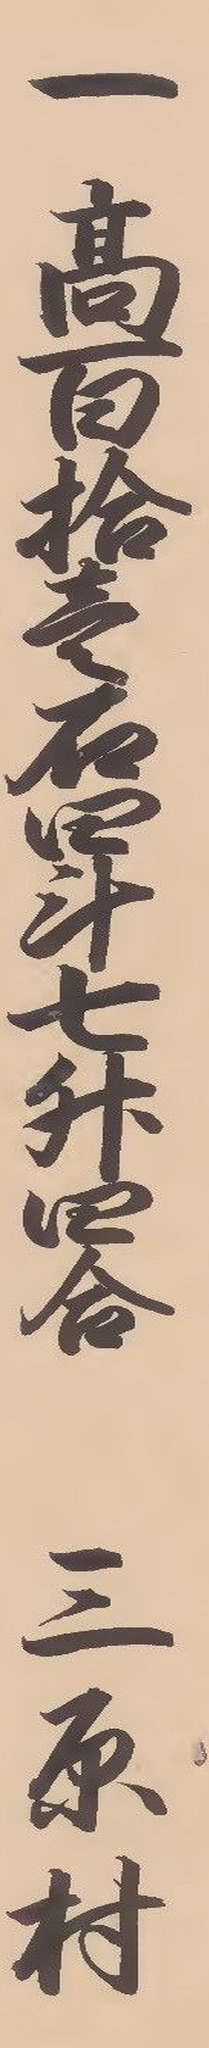一高百拾壱石四斗七升四合三原村
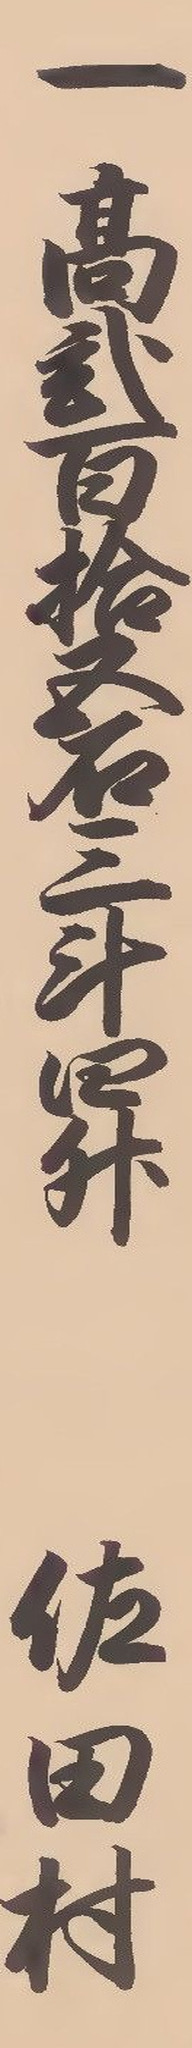一高弐百拾五石三斗四升佐田村
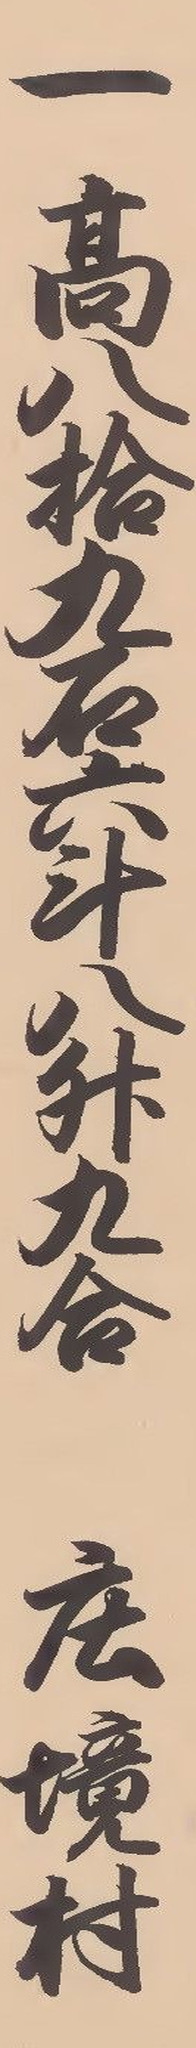一高八拾九石六斗八升九合庄境村
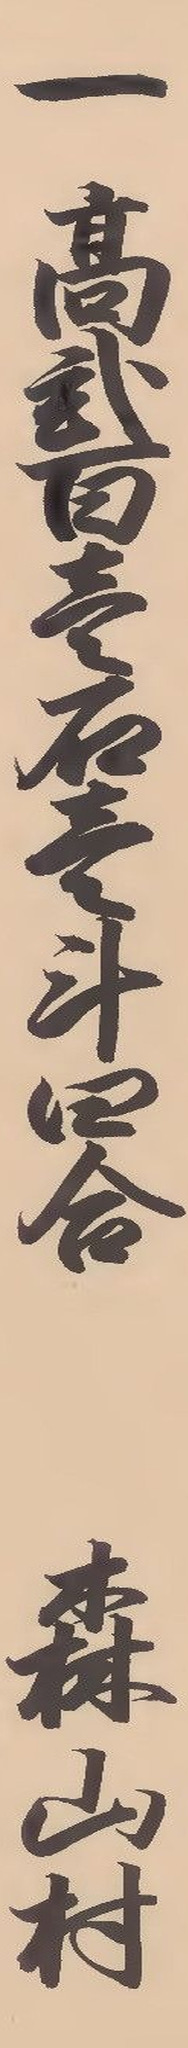一高弐百壱石壱斗四合森山村
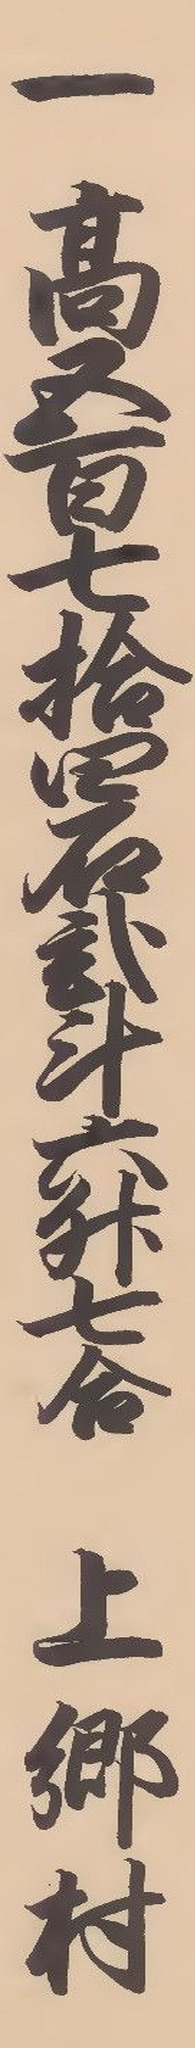一高五百七拾四石弐斗六升七合上郷村
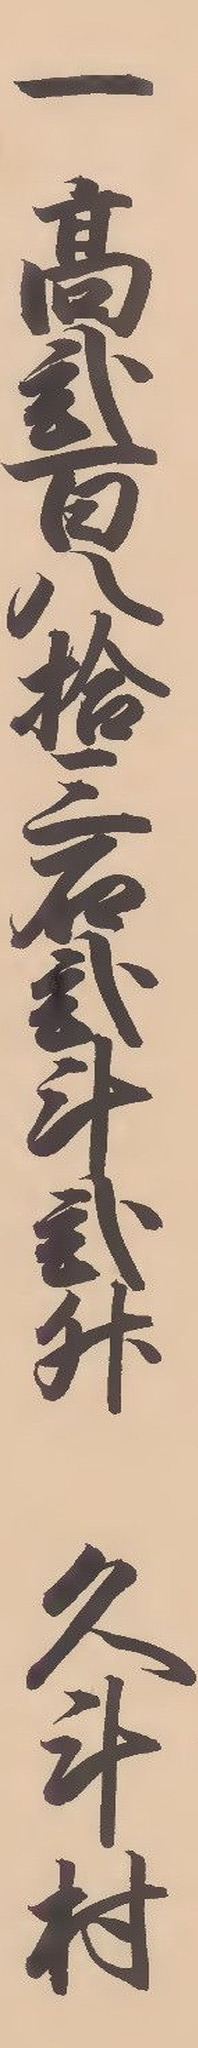一高弐百八拾三石弐斗弐升久斗村

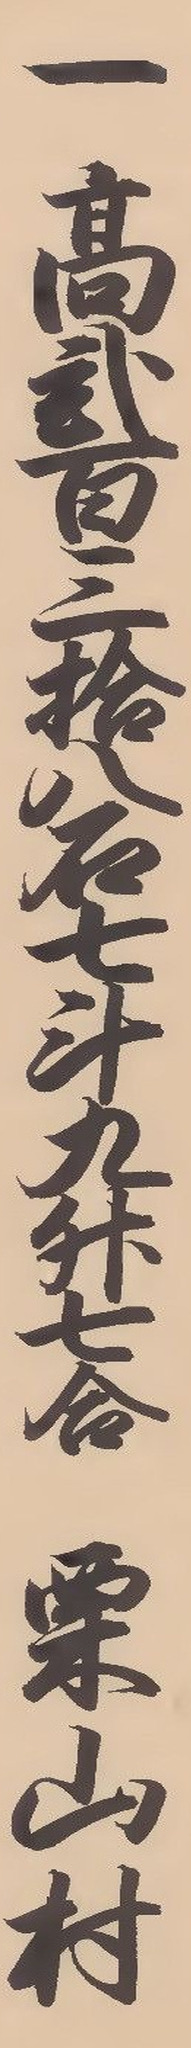一高弐百三拾八石七斗九升七合栗山村
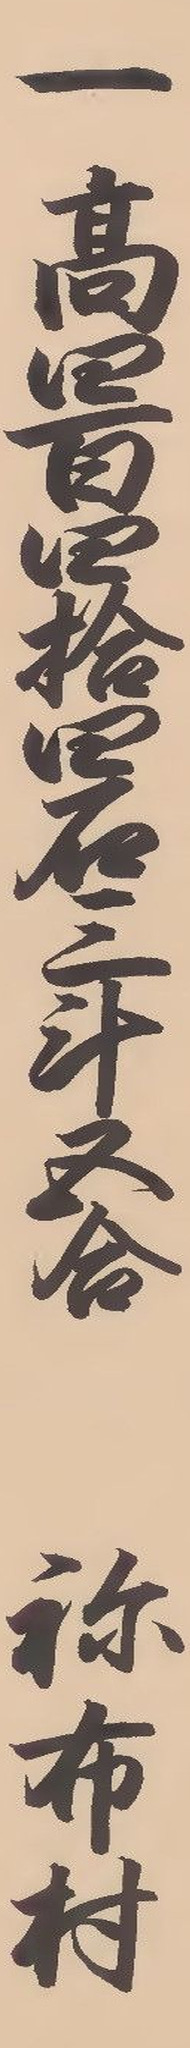一高四百四拾四石三斗五合弥布村
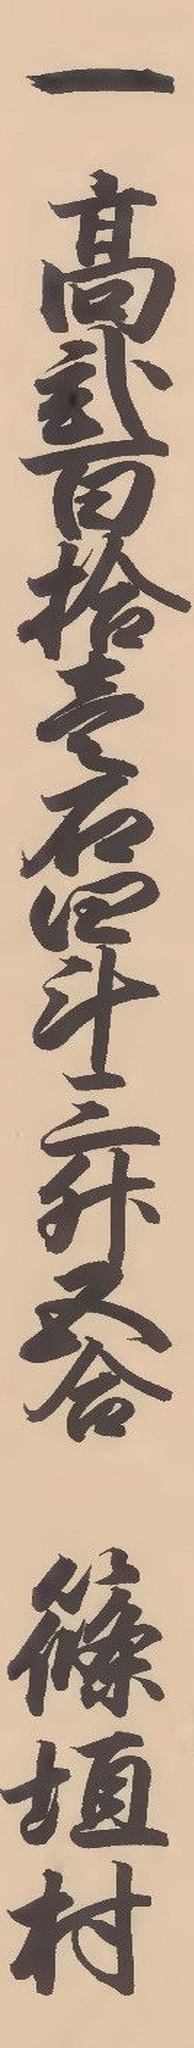一高弐百拾壱石四斗三升五合篠垣村
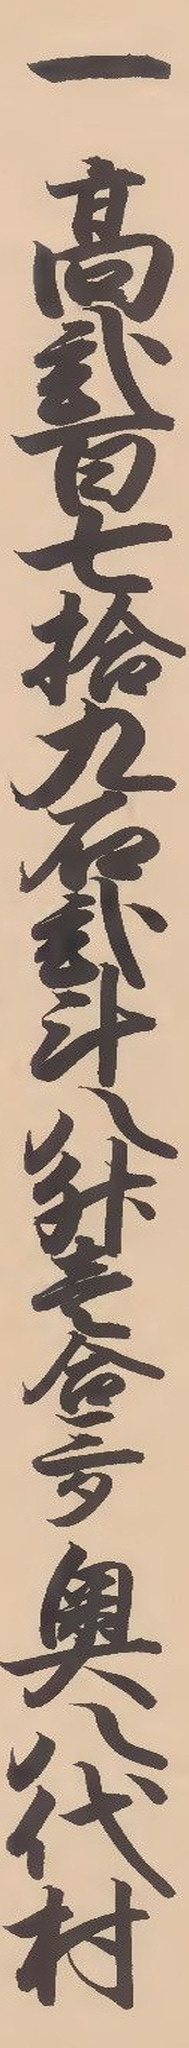一高弐百七拾九石弐斗八升壱合三勺奥八代村
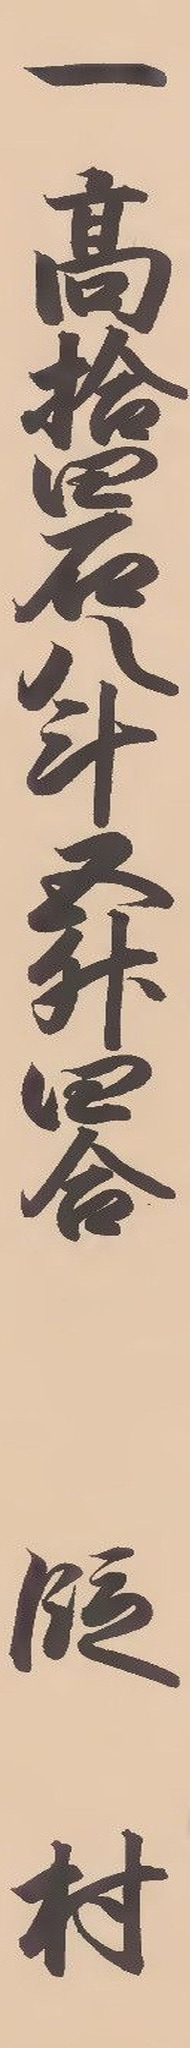一高拾四石八斗五升四合順村
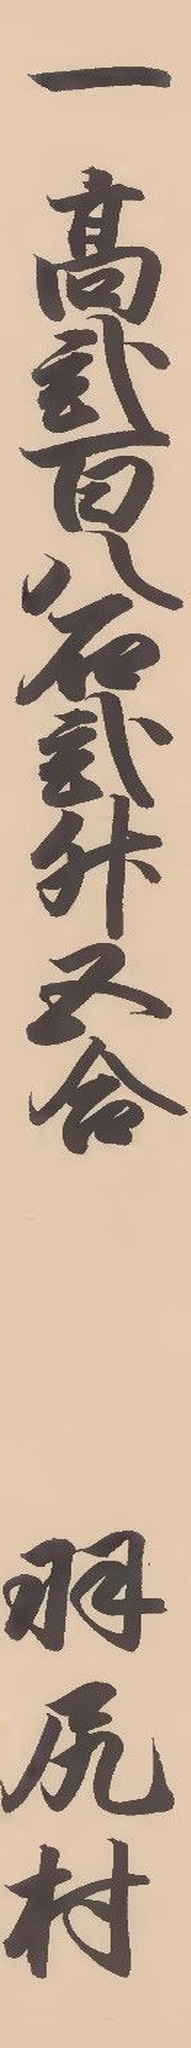一高弐百八石弐升五合羽尻村
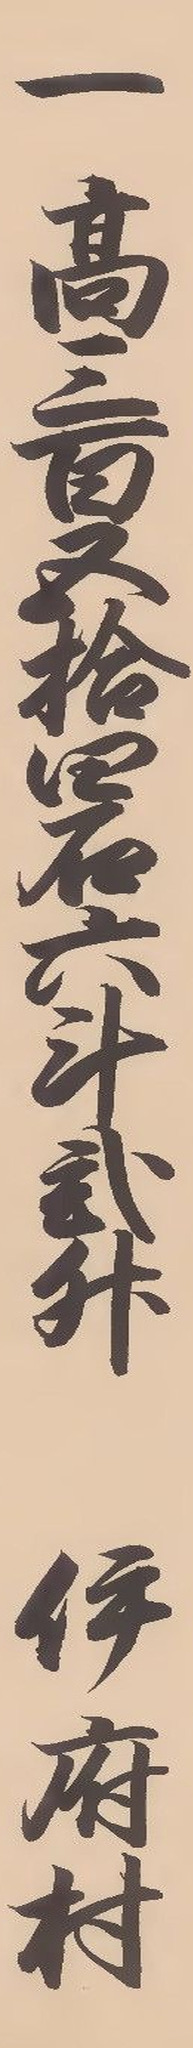一高三百五拾四石六斗弐升伊府村
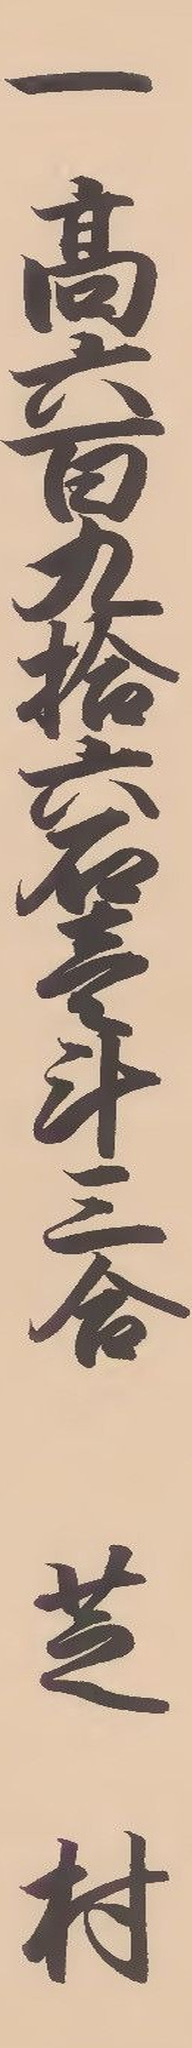一高六百九拾六石壱斗三合芝村

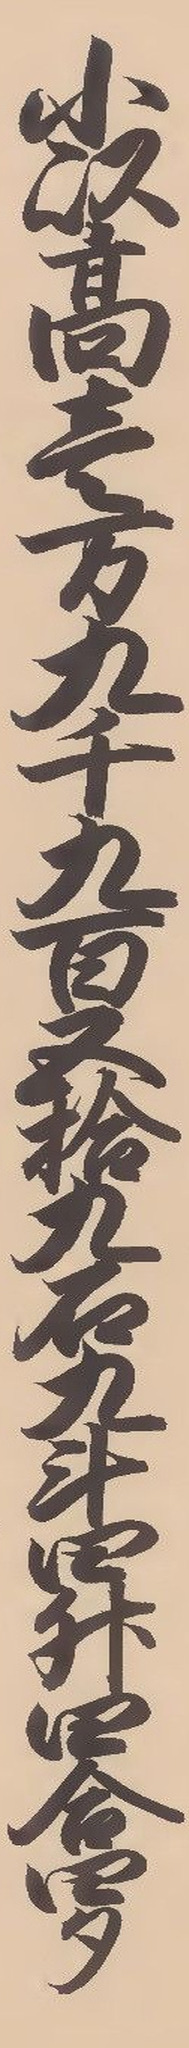小以高壱万九千九百五拾九石九斗四升四合四勺
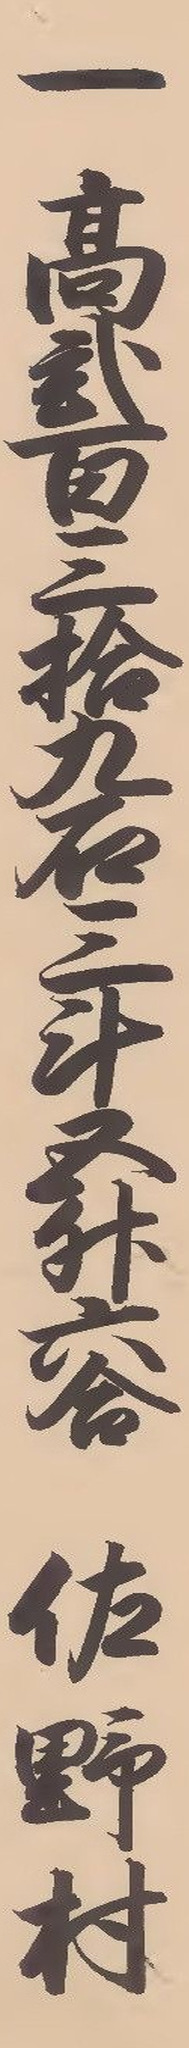一高弐百三拾九石三斗五升六合佐野村
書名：但馬国郷帳
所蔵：国立公文書館 National Archives of Japan
